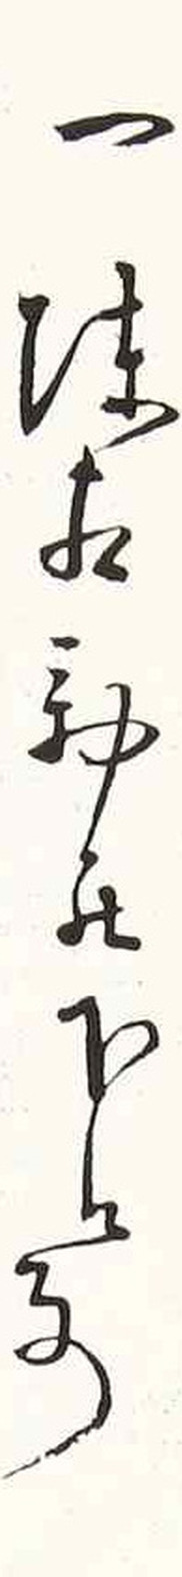一陣相勤罷下候事
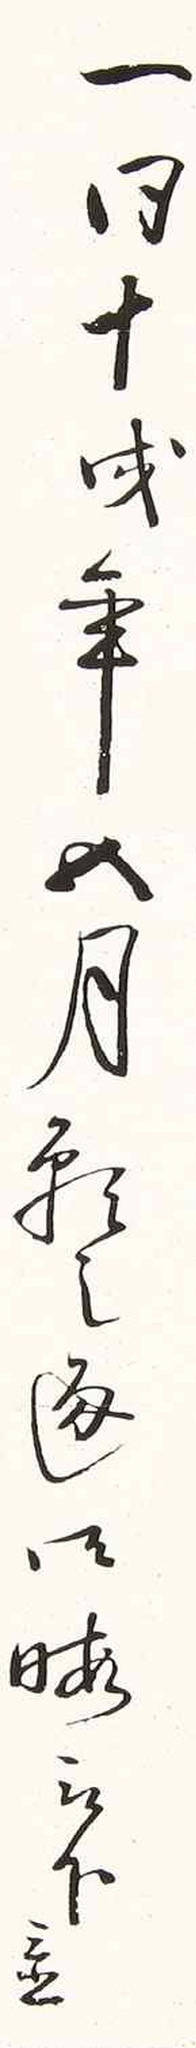一同十戌年五月願之通御暇被下置
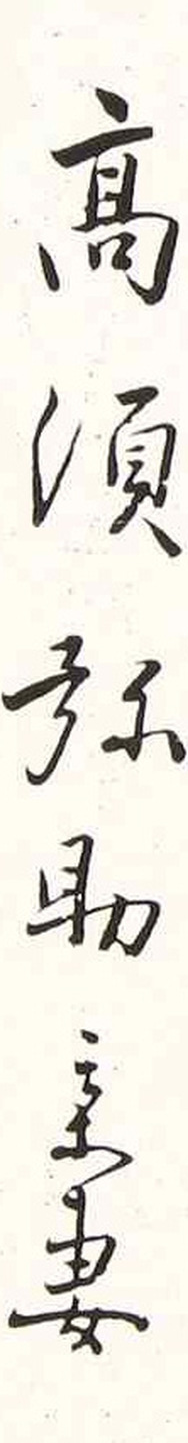女高須弥助某妻
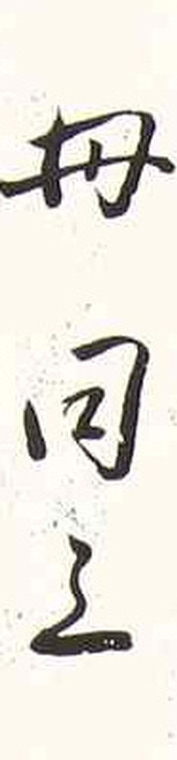母同上
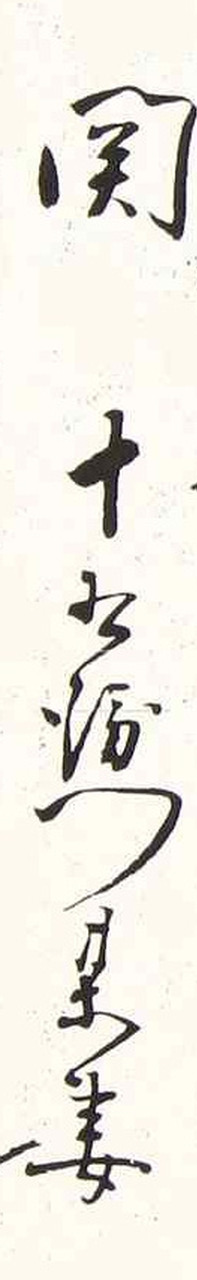女関十右衛門某妻
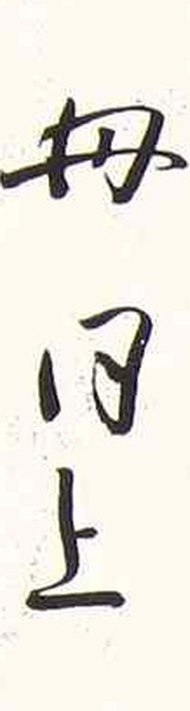母同上
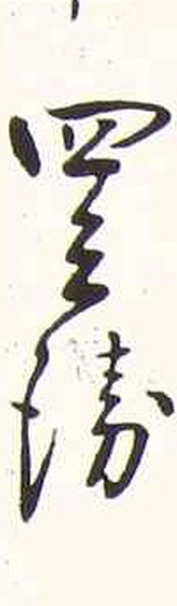四兵衛

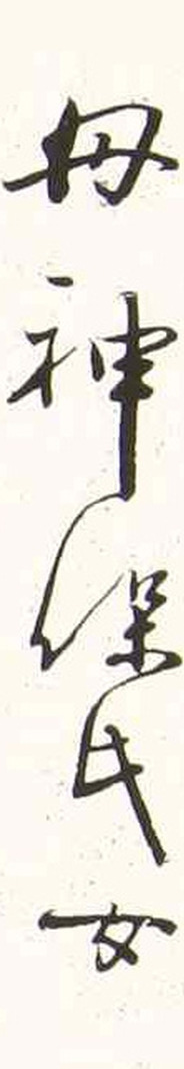母神保氏女
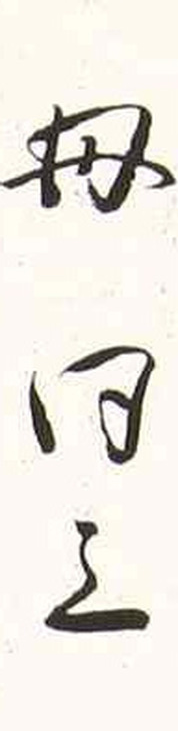母同上
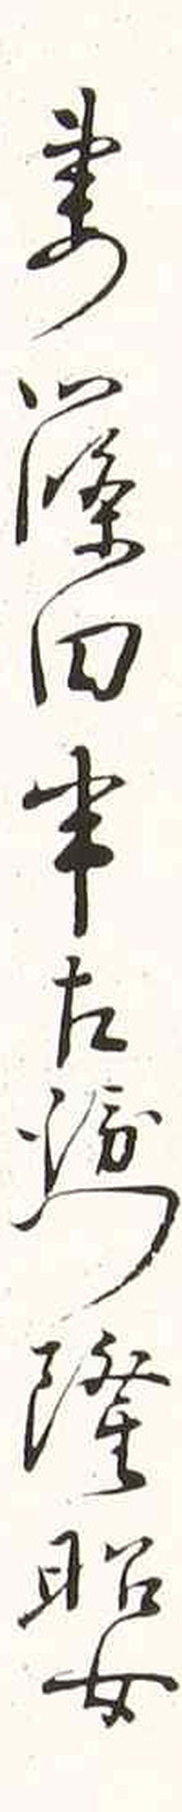妻篠田半左衛門隆昭女
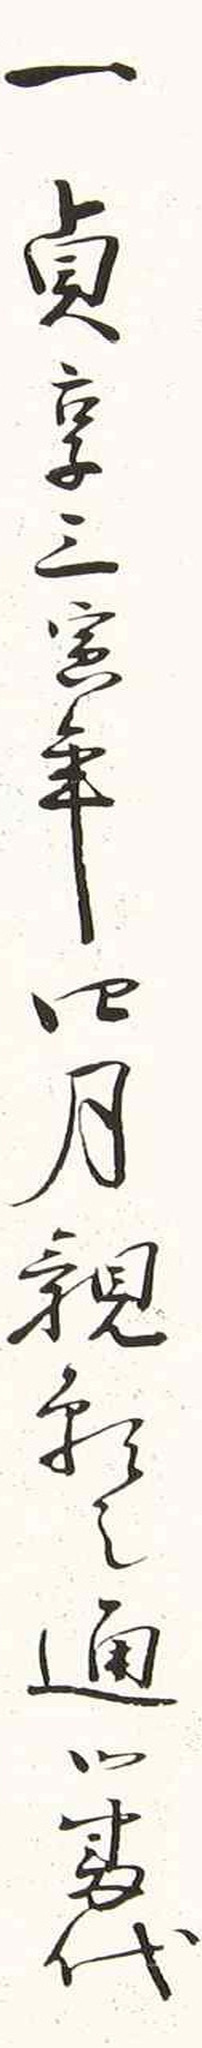一貞享三寅年四月親願之通御番代
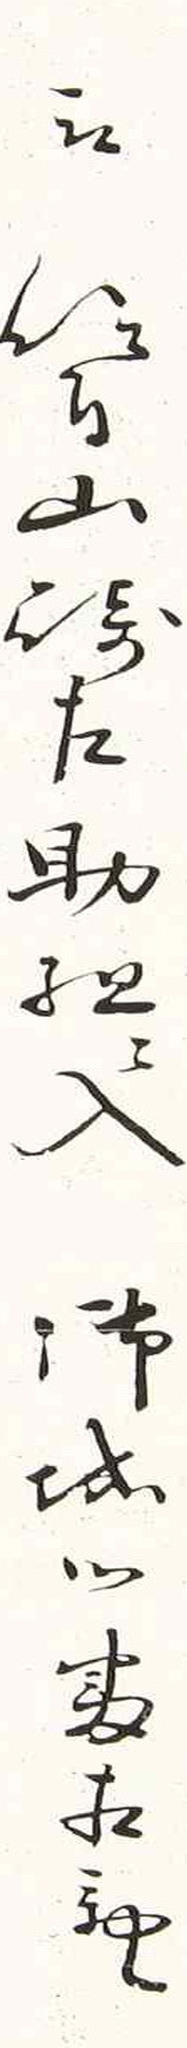被仰付山崎左助組ニ入御城御番相勤候
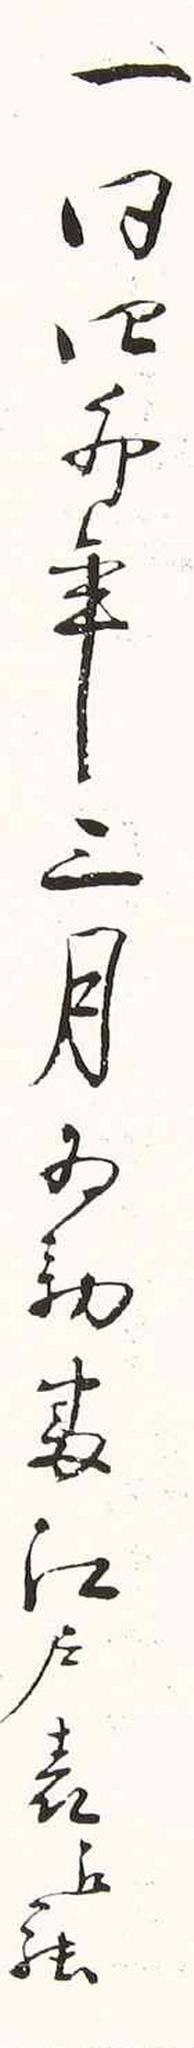一同四卯年三月為勤番江戸表江罷
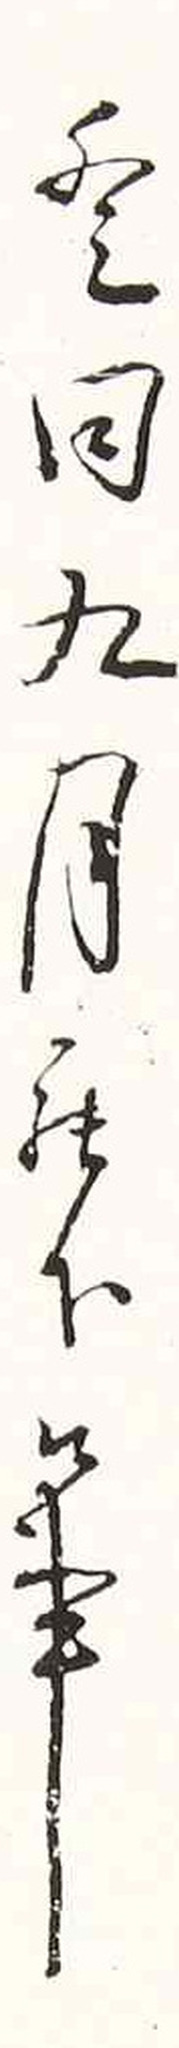登同九月罷下候事
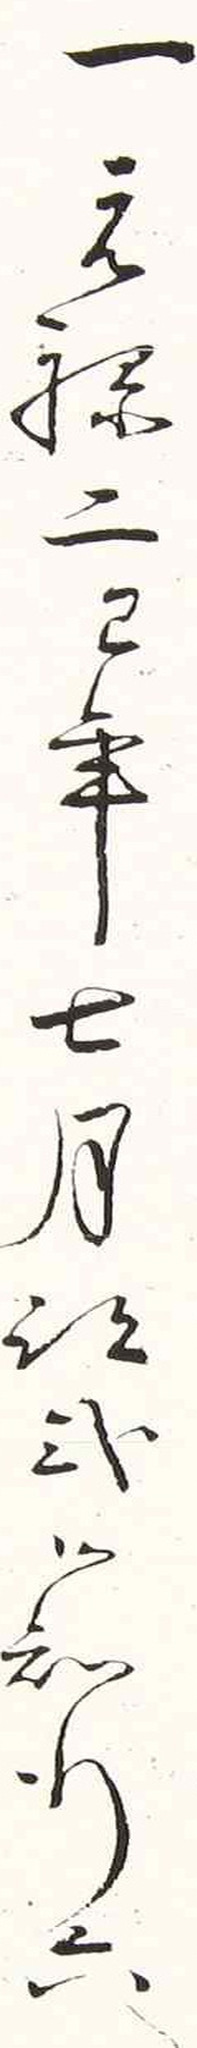一元禄二巳年七月跡式御知行六
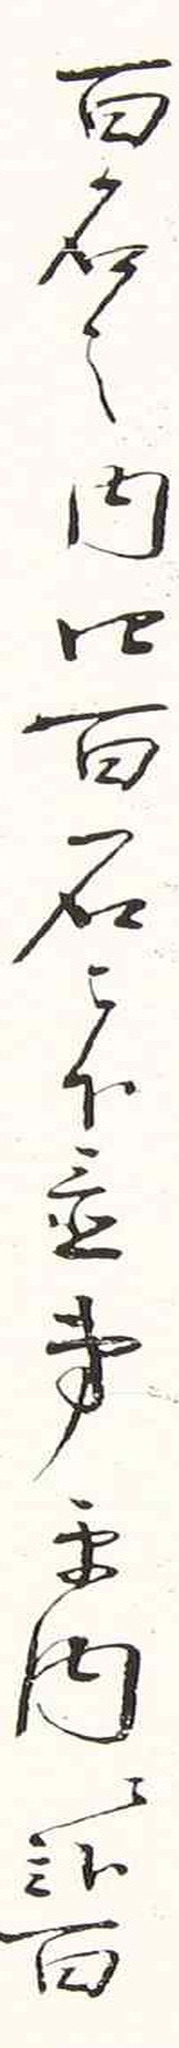百石之内四百石被下置事弟平内ニ弐百
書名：諸士系譜　巻之357　す之部7
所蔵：会津若松市立会津図書館
